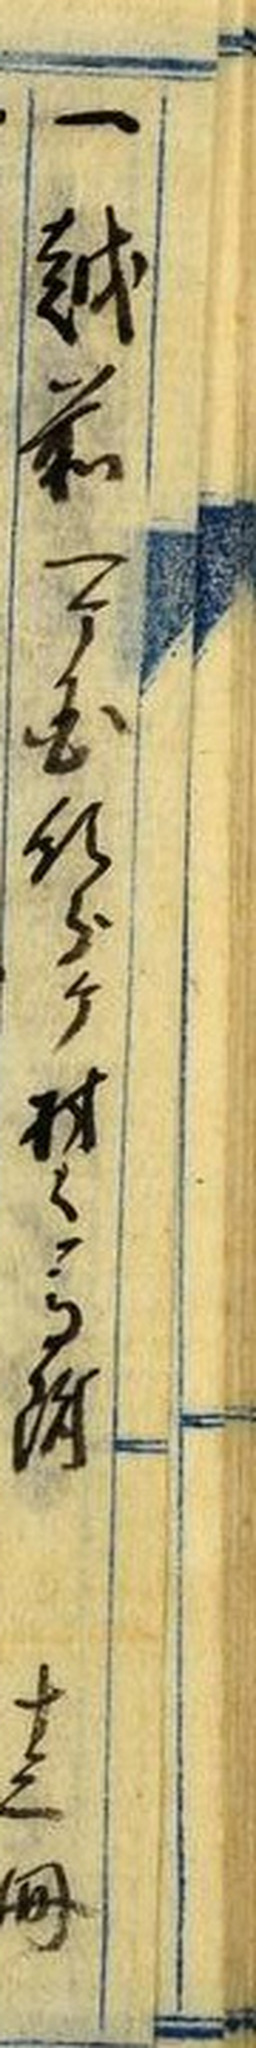一越前一ヶ国領分ヶ村之高附十三冊
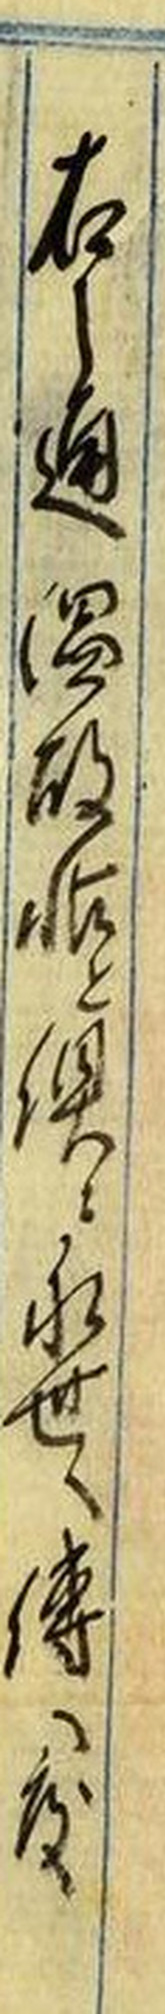右之通温故帳と倶に永世へ伝へ度
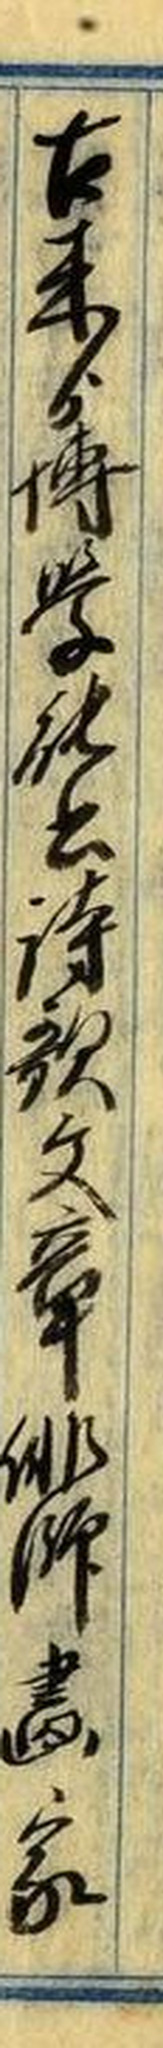古来ゟ博学能書詩歌文章俳師画家
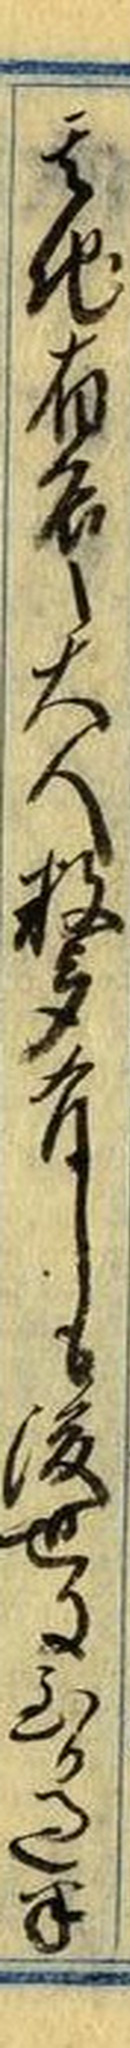其他有名之大人数多有しも後世に至り過半
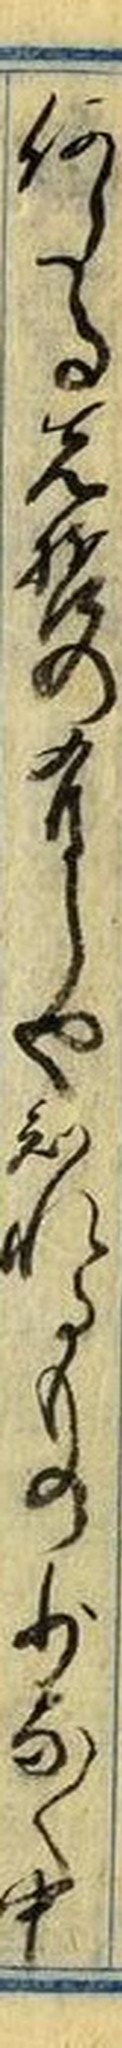何たる先哲の有しや知れるもの少なく中
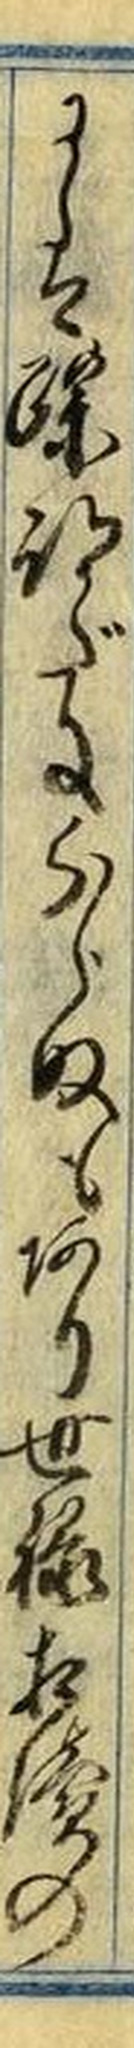には城跡だに分らぬもあり世禄相続の
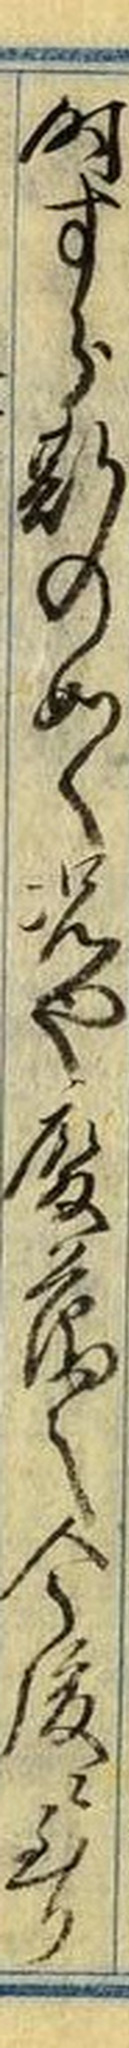時すら斯の如く況や廃藩之今後に至り
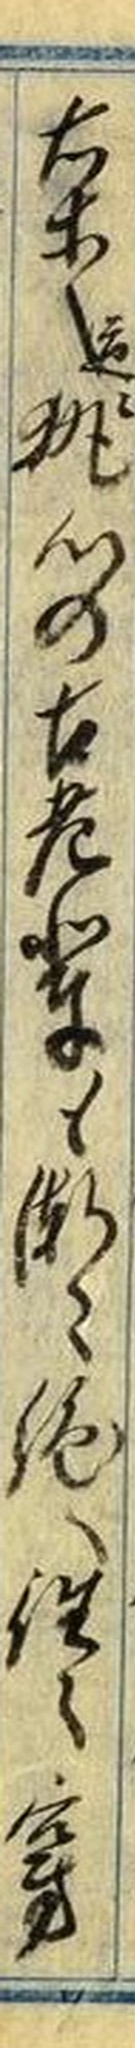右等之道に執心の古老輩も漸々絶へ往々穿
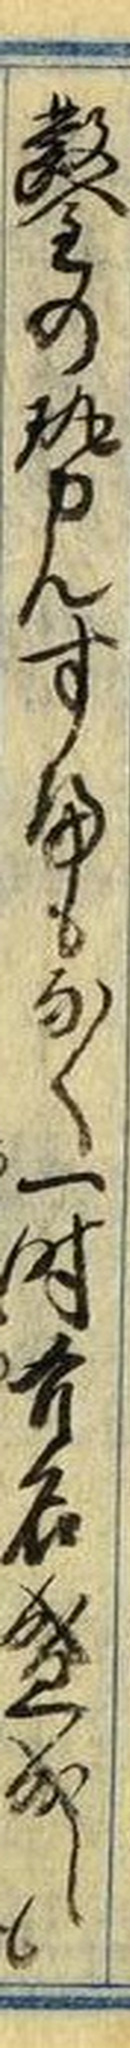鑿の勢んすへもなく一時有名盛成しも
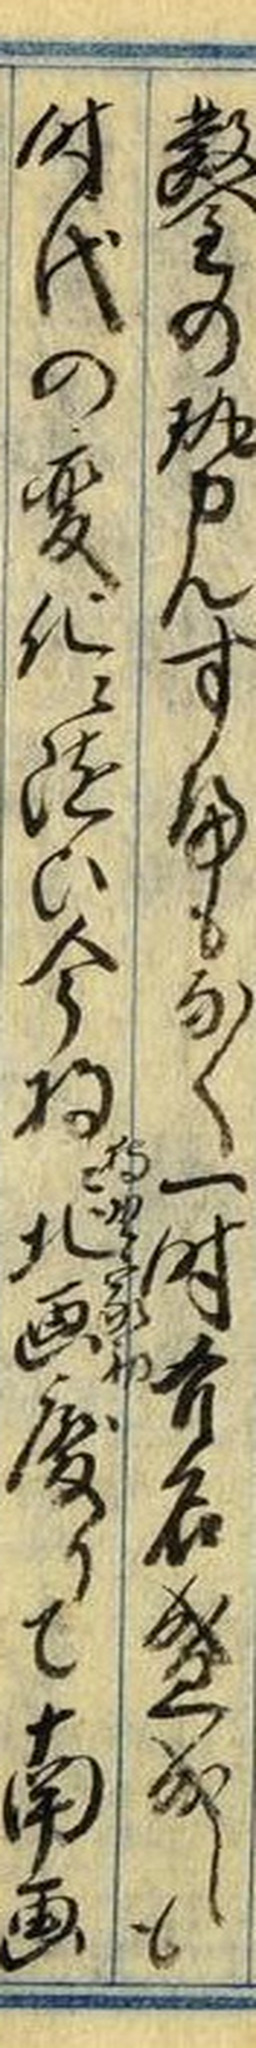時代の変化に随ひ今将に北画廃りて南画
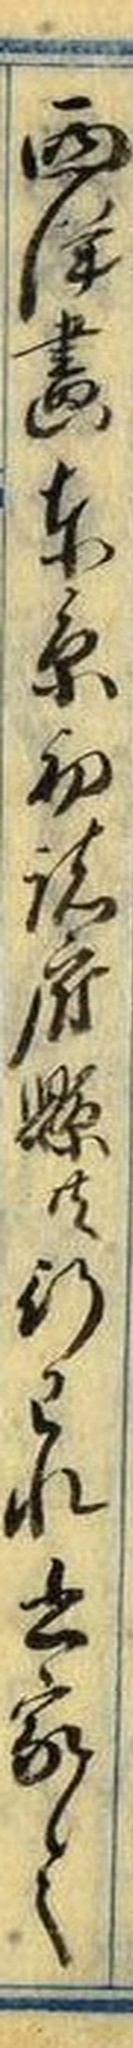西洋画東京初諸府県共行われ書家之

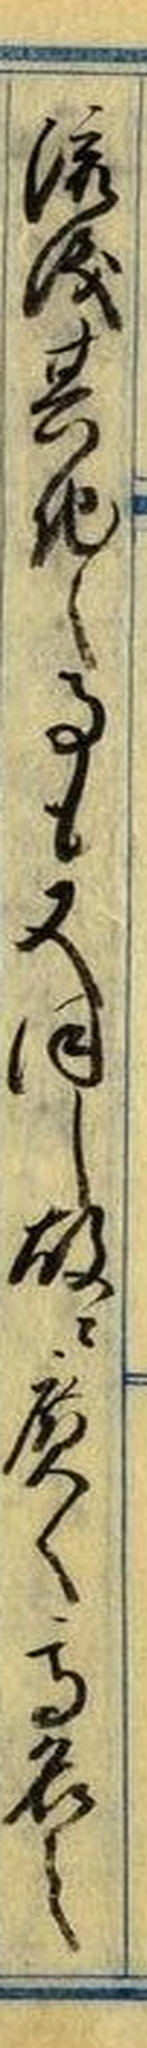流儀其他之事も又同し故に広く高名之
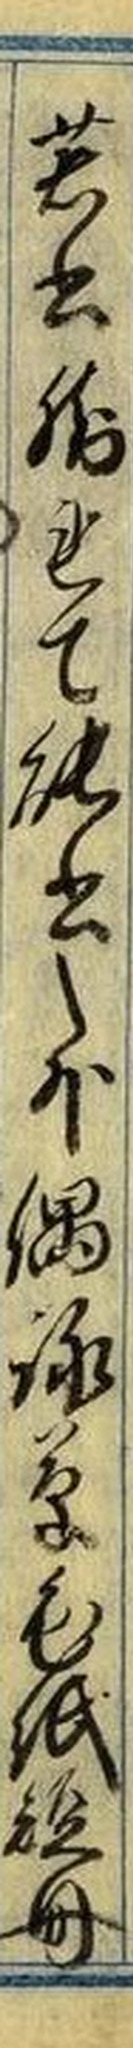著書勝れて能書之外偶詠草色紙短冊
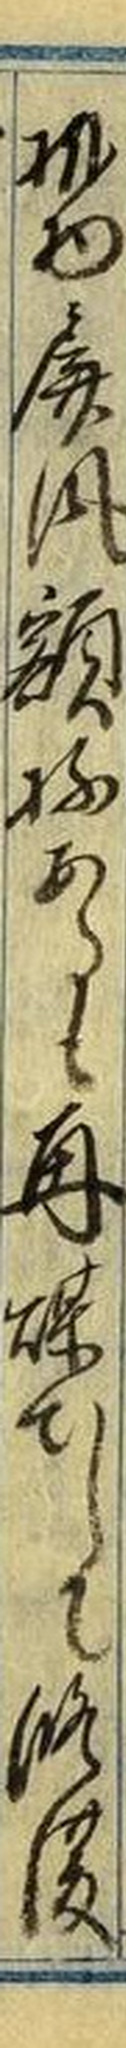掛物屏風額抔あるも再煤出して修復
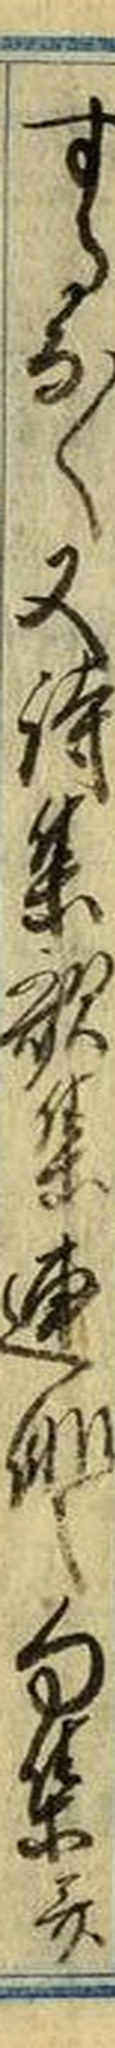するなく又詩歌歌集連俳の句集并
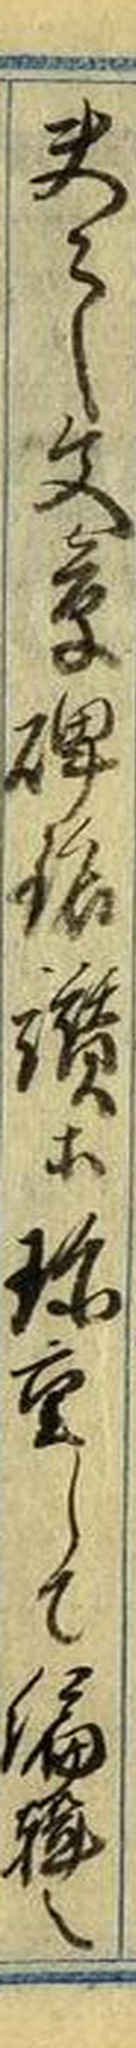夫々之文章碑銘讃等珍重して編輯之
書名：温古集 四巻
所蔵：福井県文書館 Fukui Prefectural Archives
